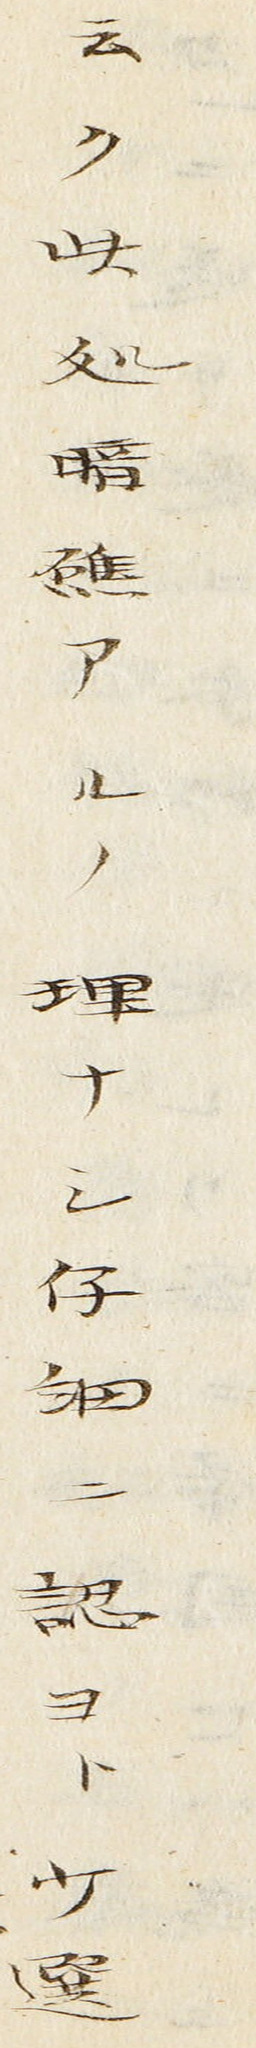云ク此処暗礁アルノ理ナシ仔細ニ認ヨト少選
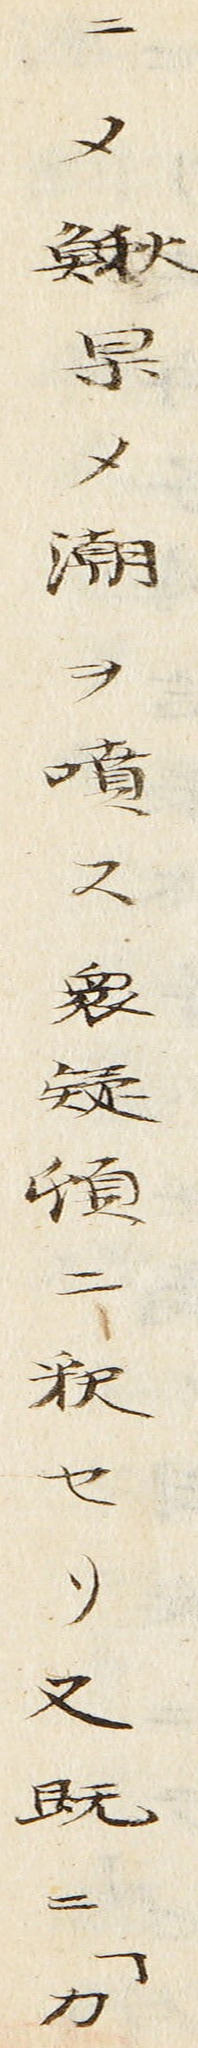ニシテ鰍果シテ潮ヲ噴ス衆疑頓ニ釈セリ又既ニ「カ
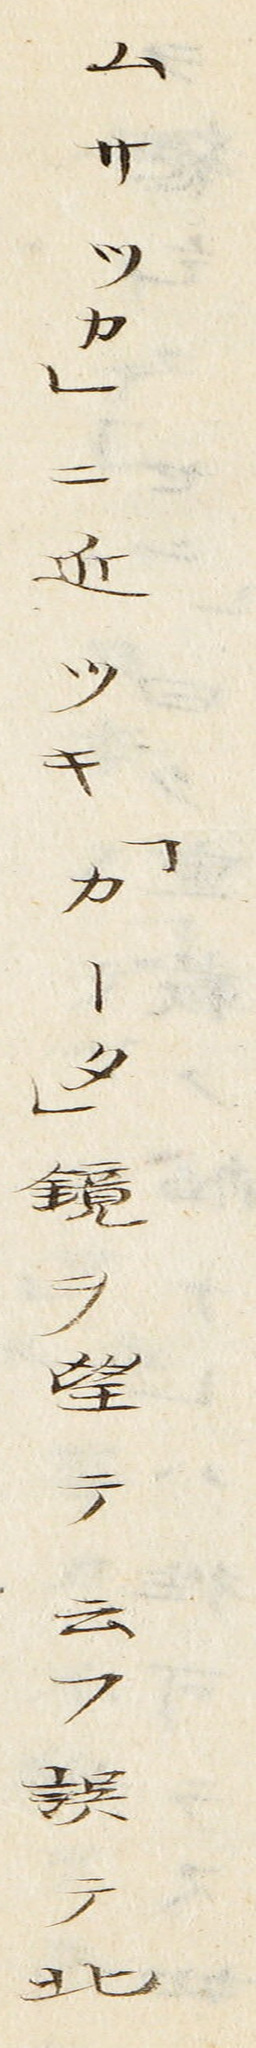ムサツカ」ニ近ツキ「カータ」鏡ヲ望テ云フ誤テ北
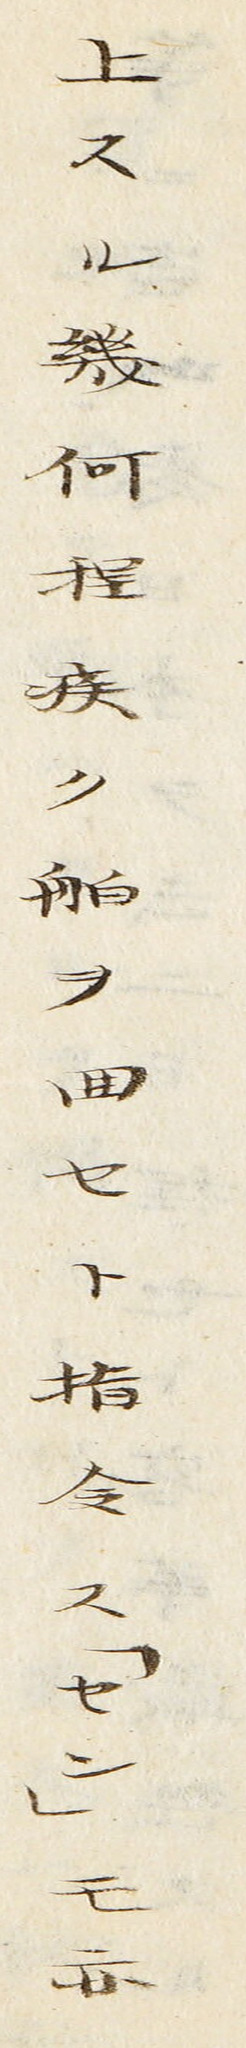上スル幾何程疾ク舶ヲ回セト指令ス「セン」モ亦
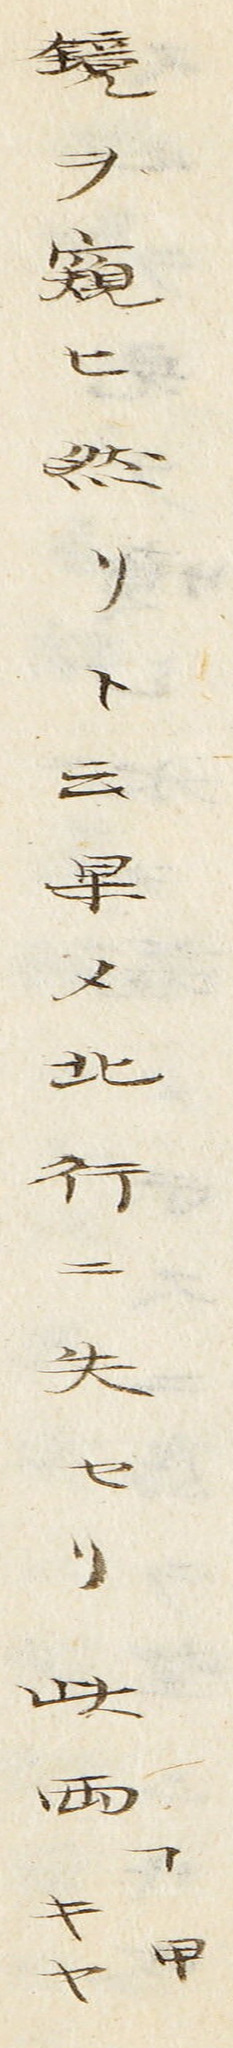鏡ヲ窺ヒ然リト云果シテ北行ニ失セリ此両「キヤ
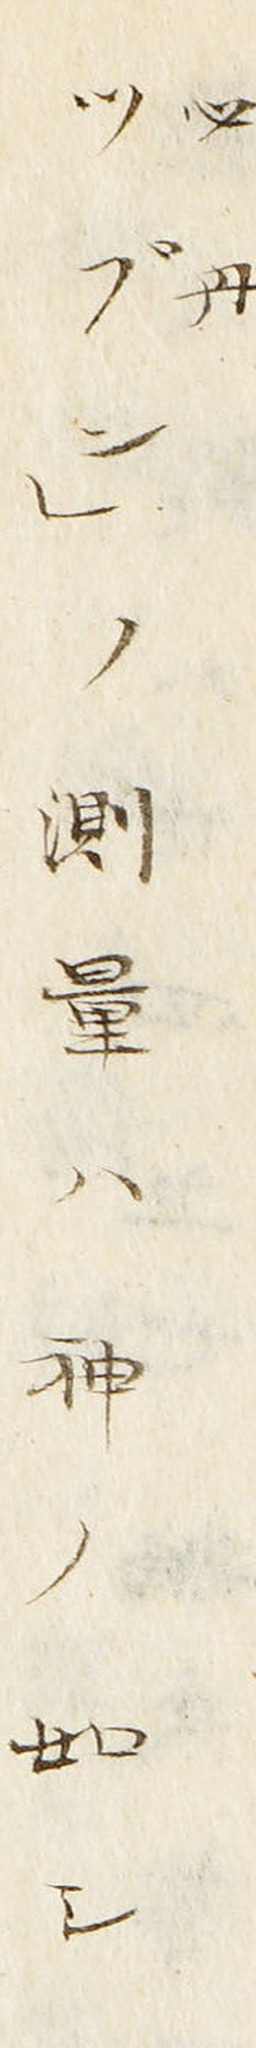ツプン」ノ測量ハ神ノ如シ
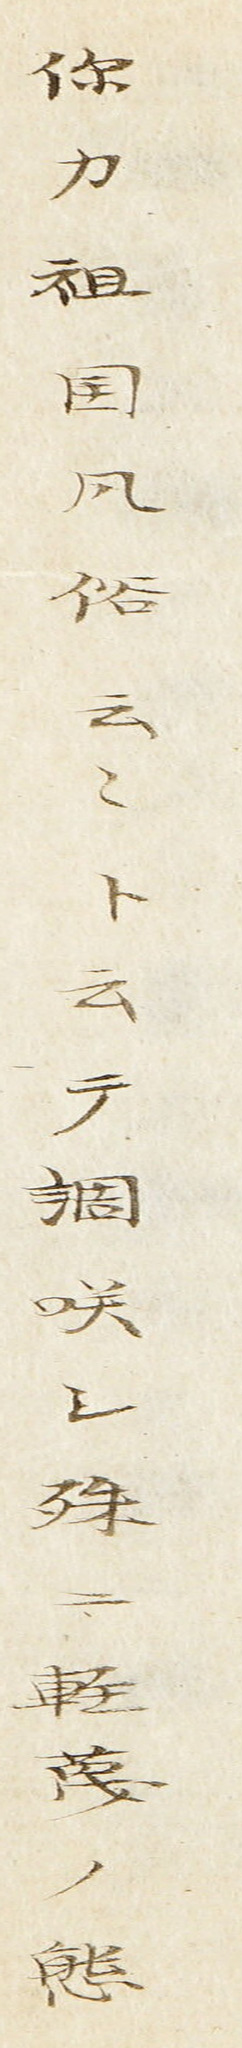你カ祖国風俗云々ト云テ調咲シ殊ニ軽蔑ノ態
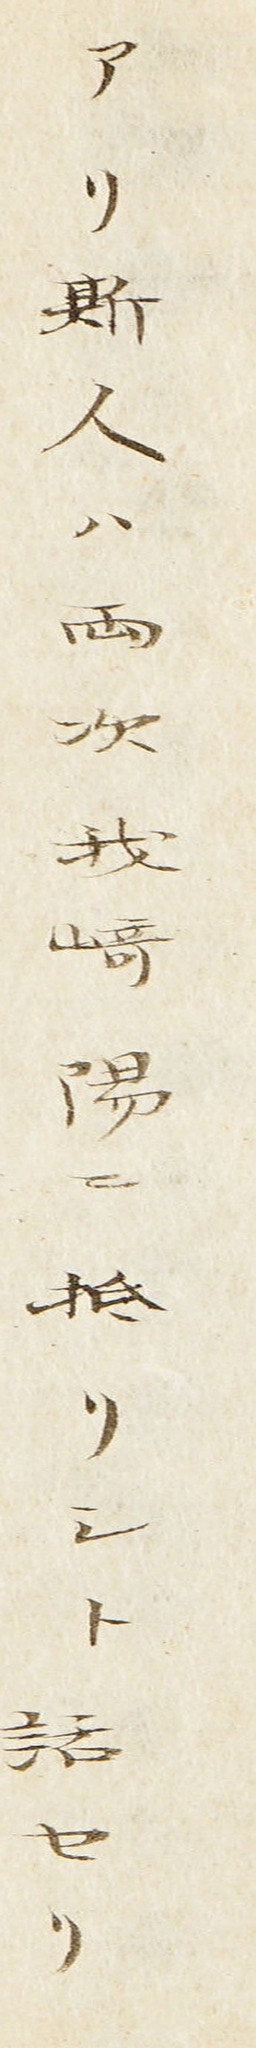アリ斯人ハ両次我崎陽ニ抵リシト話セリ
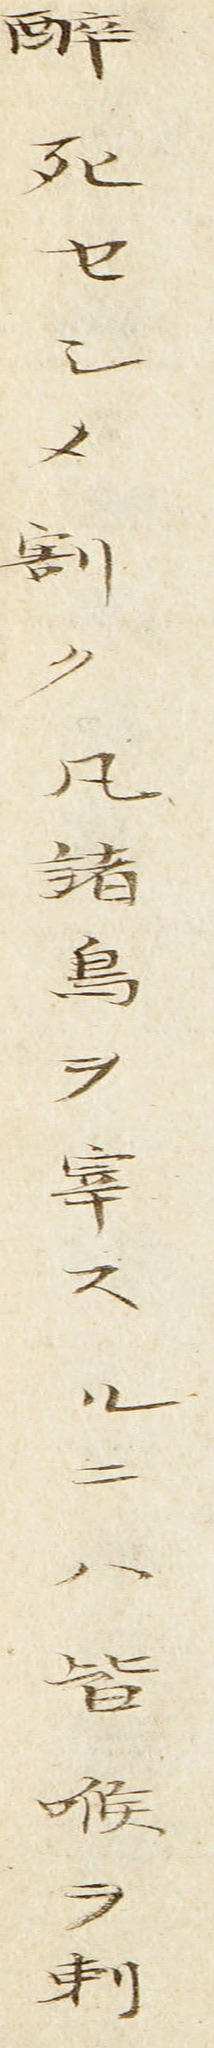酔死セシメ割ク凡諸島ヲ宰スルニハ皆喉ヲ刺

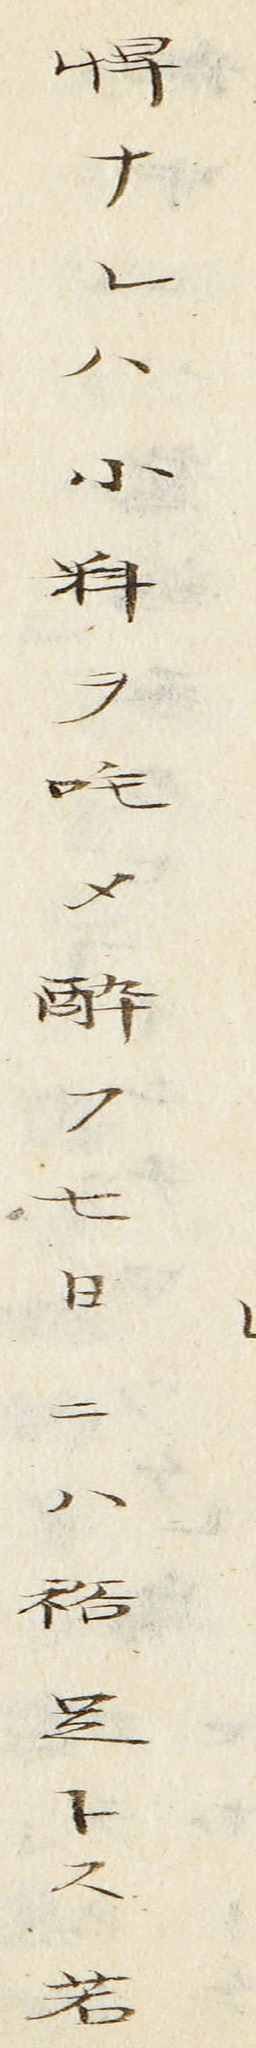悍ナレハ小料ヲ吃シテ酔フ七日ニハ裕足トス若
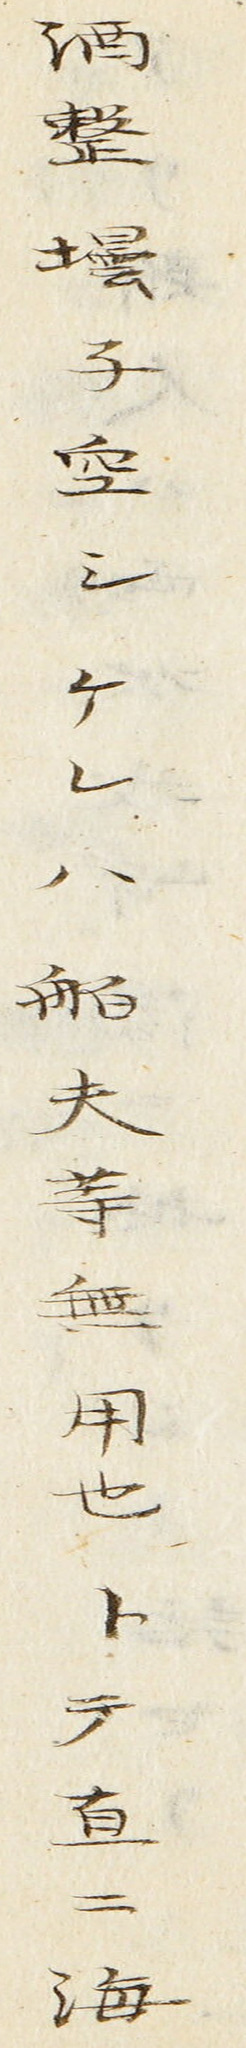酒整壜子空シケレハ舶夫等無用也トテ直ニ海
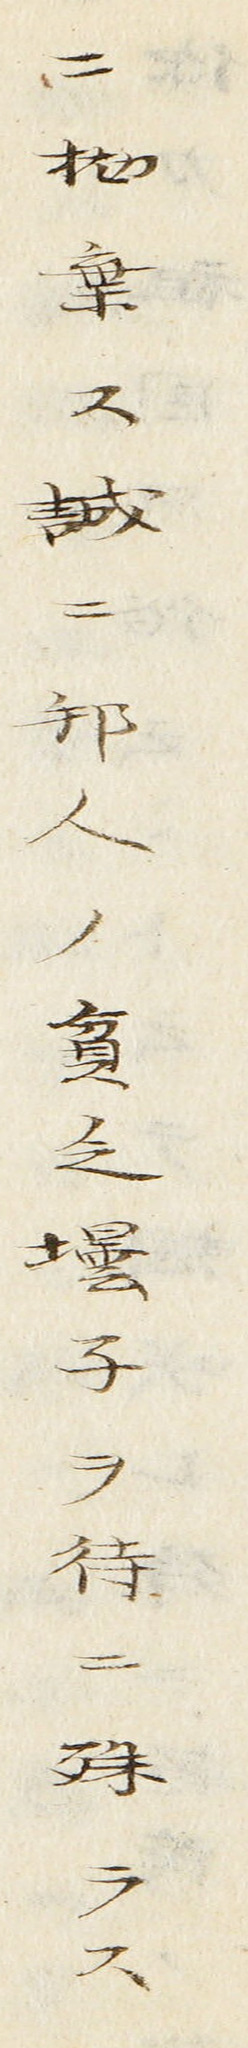ニ抛棄ス誠ニ邦人ノ貧乏壜子ヲ待ニ殊ラス
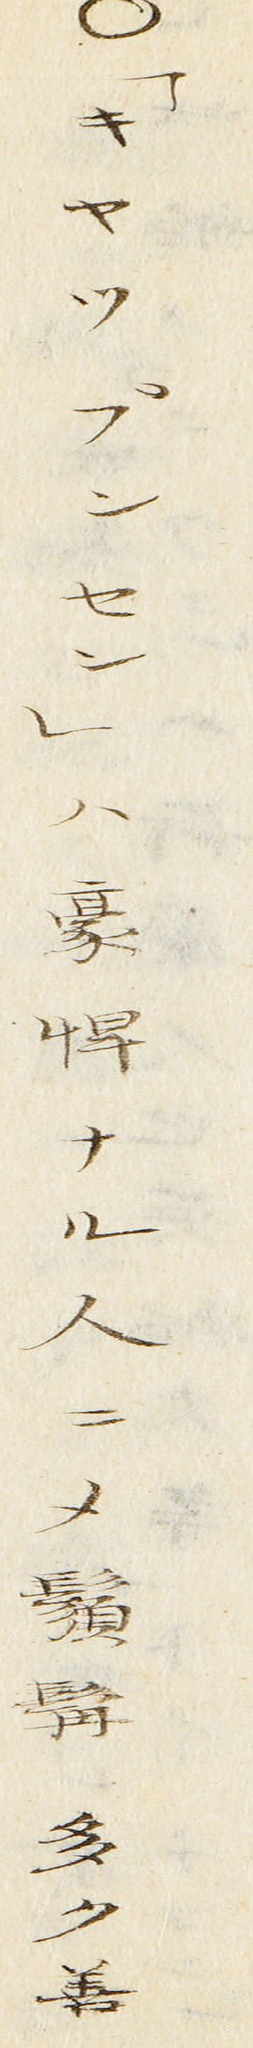○「キヤツプンセン」ハ豪悍ナル人ニシテ鬚髯多ク善
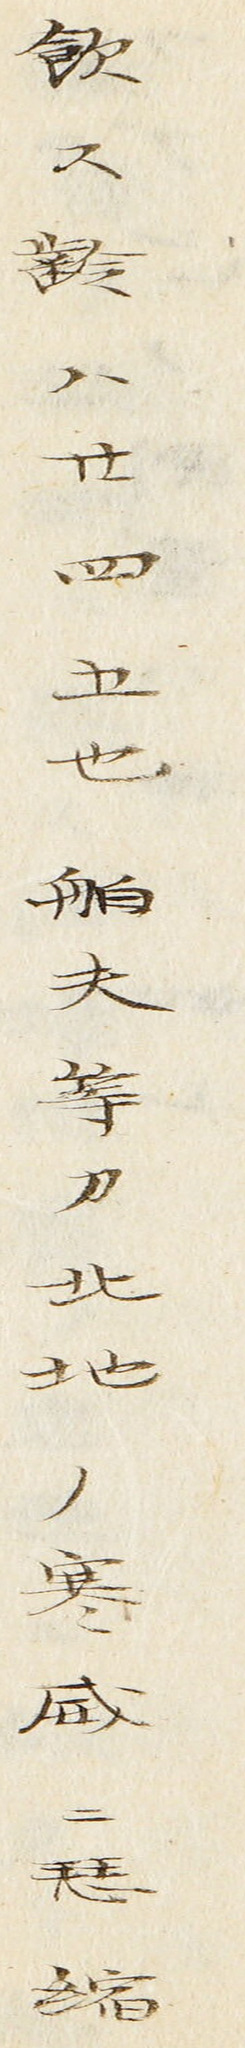飲ス齢ハ廿四五也舶夫等カ北地ノ寒威ニ瑟縮
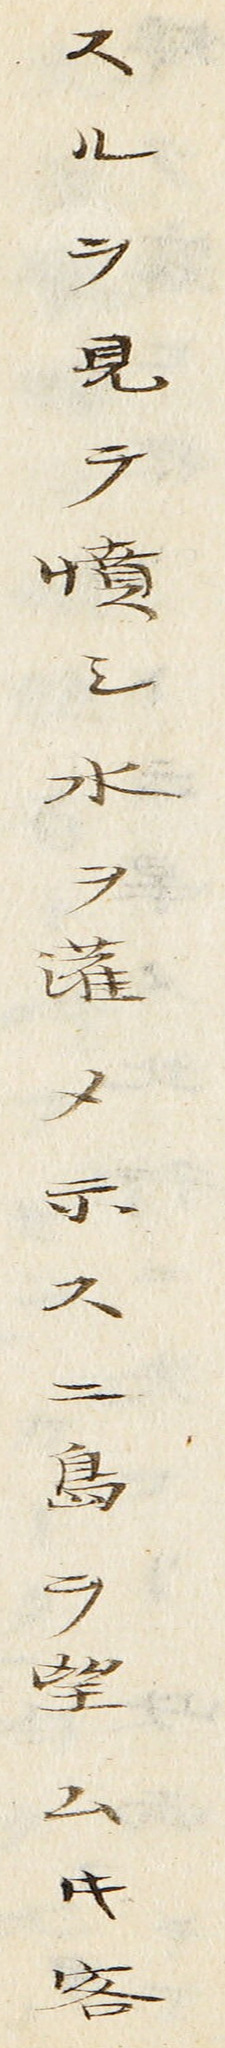スルヲ見テ憤シ水ヲ潅シテ示スニ島ヲ望ムトキ客
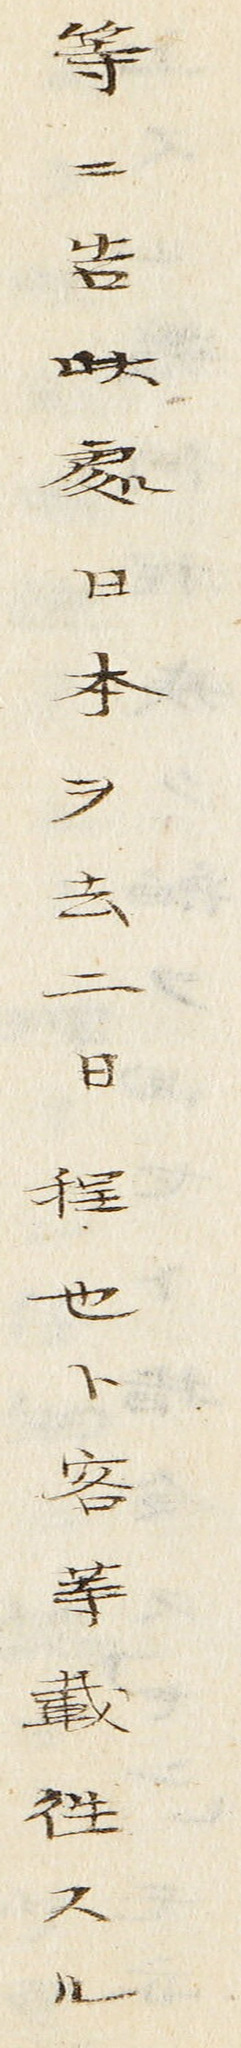等ニ告此処日本ヲ去二日程也ト客等載往スル
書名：流蕃通書
